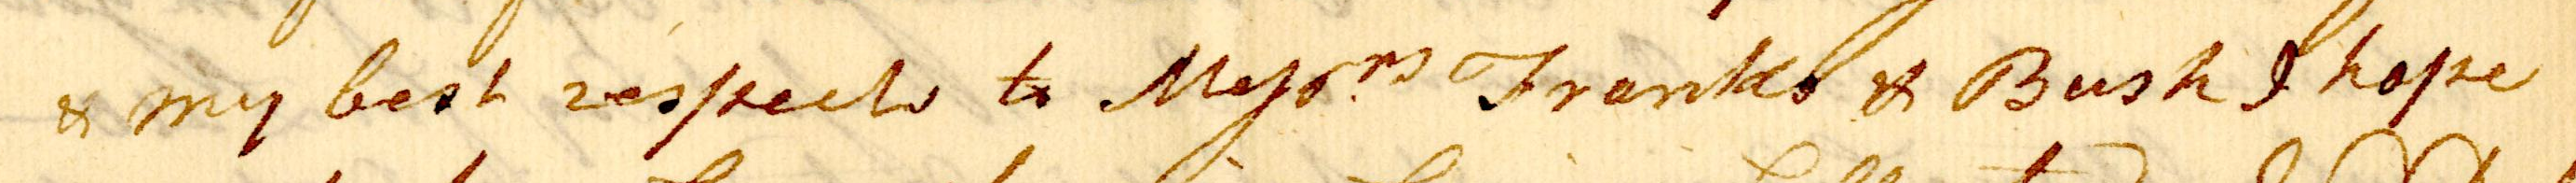& my best respects to Mess^rs. Frankss & Bush I hope
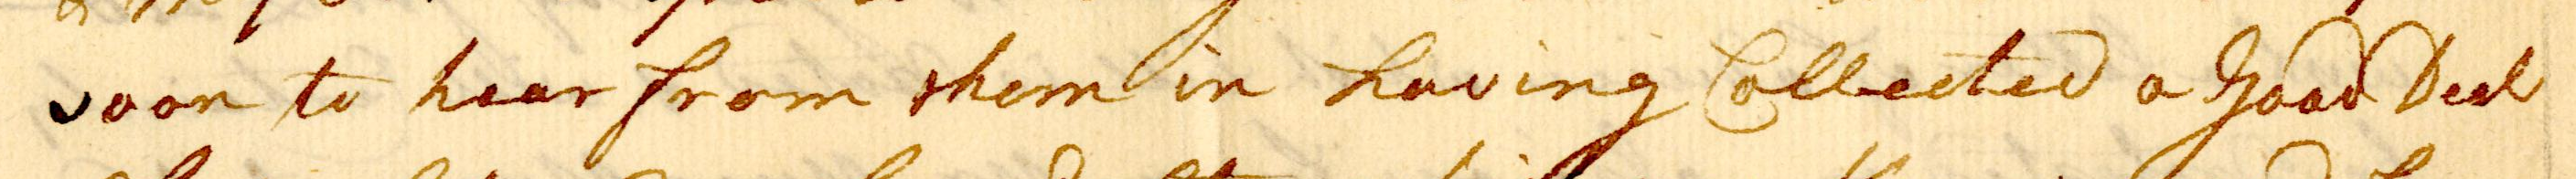soon to hear from them in having Collected a Good deal
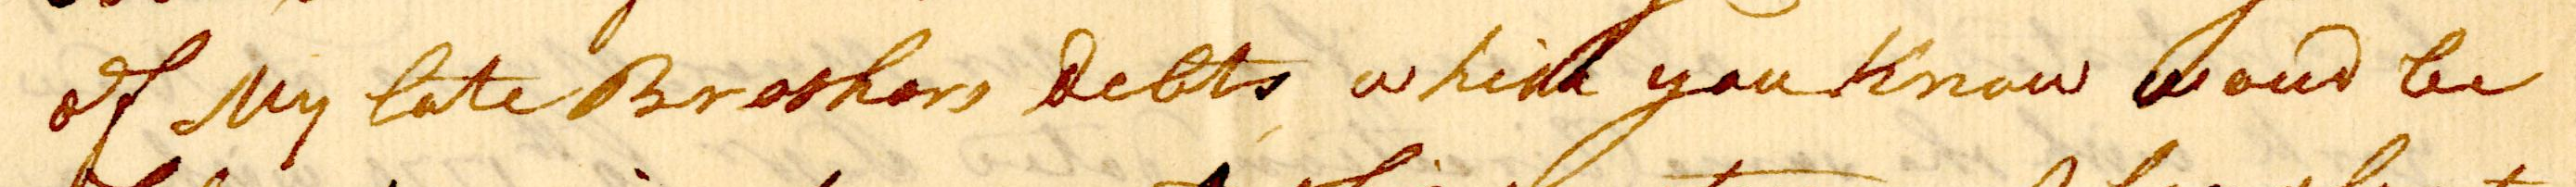of My late Brothers debts which you know woud be
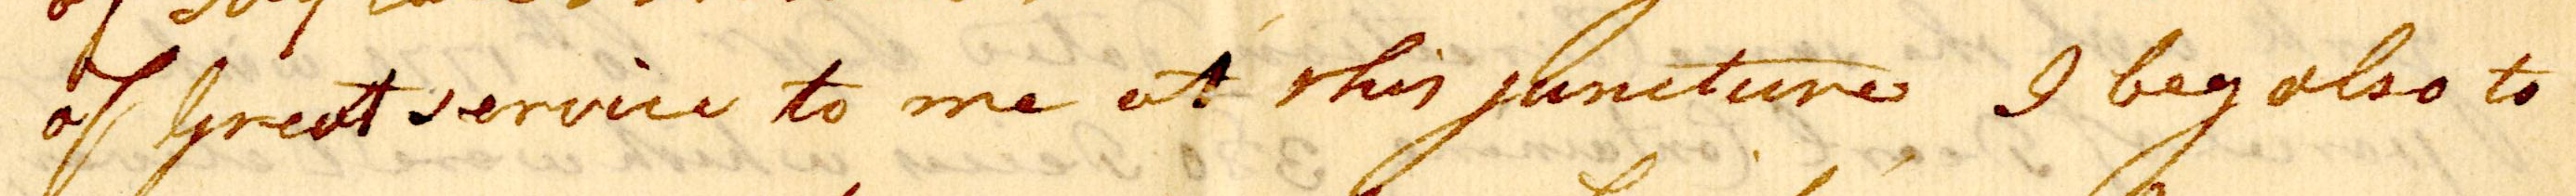of Great service to me at this juncture I beg also to
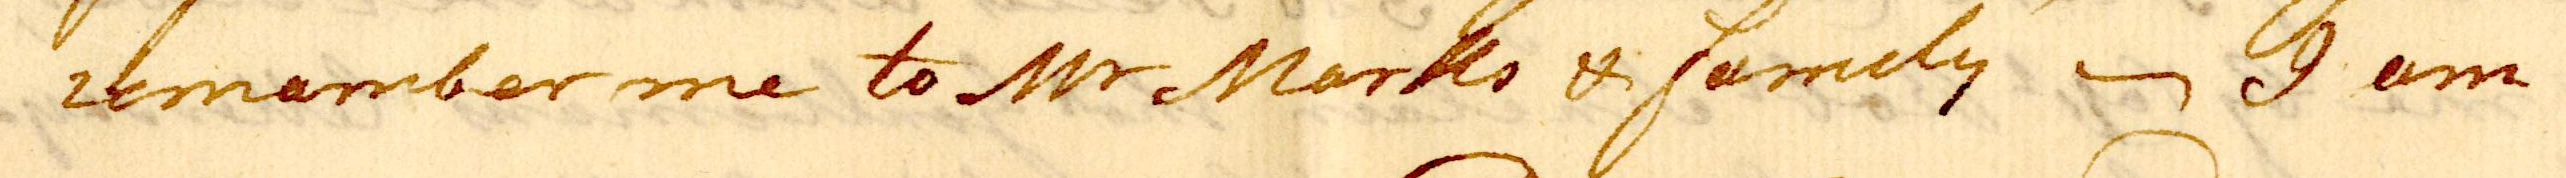remember me to M^r Marks & family- I am
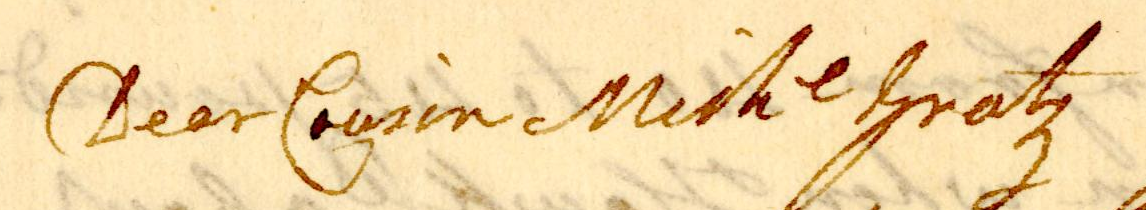Dear Cousin Mich^l Gratz
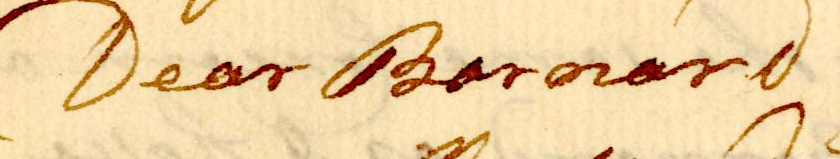Dear Barnard
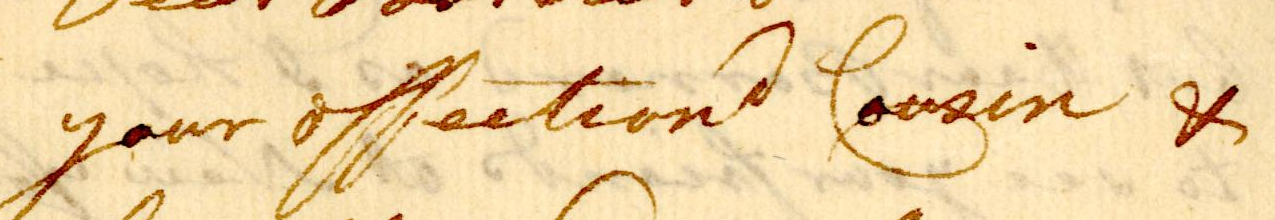your Affection^d Cousin &
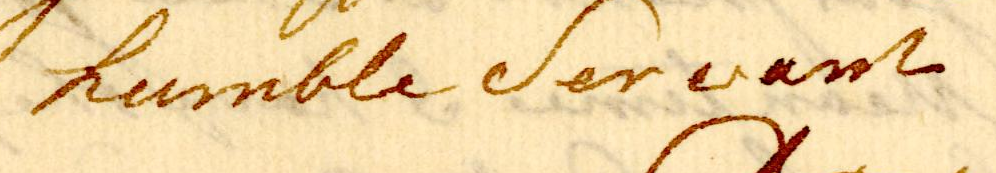humble Servant
